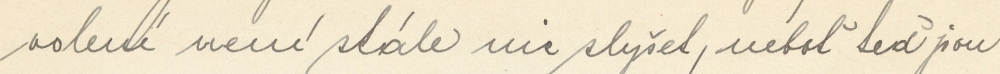volené není stále nic slyšet, neboť teď jsou
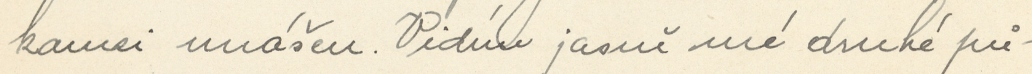kamsi unášen. Vidím jasně mé druhé pů-
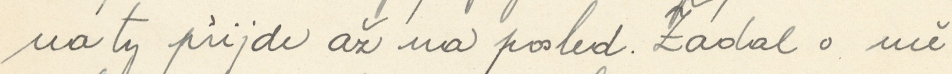na ty přijde až na posled. Žádal o mě
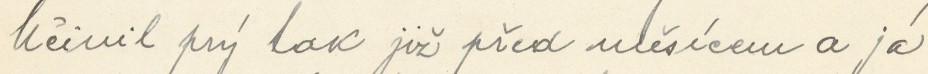Učinil prý tak již před měsícem a já
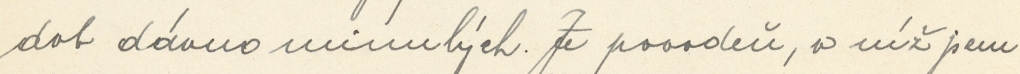dob dávno minulých. Je povodeň, v níž jsem
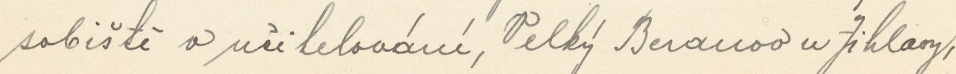sobiště v učitelování, Velký Beranov u Jihlavy,
